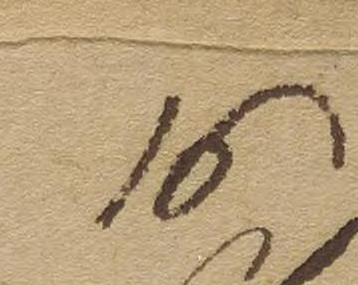16
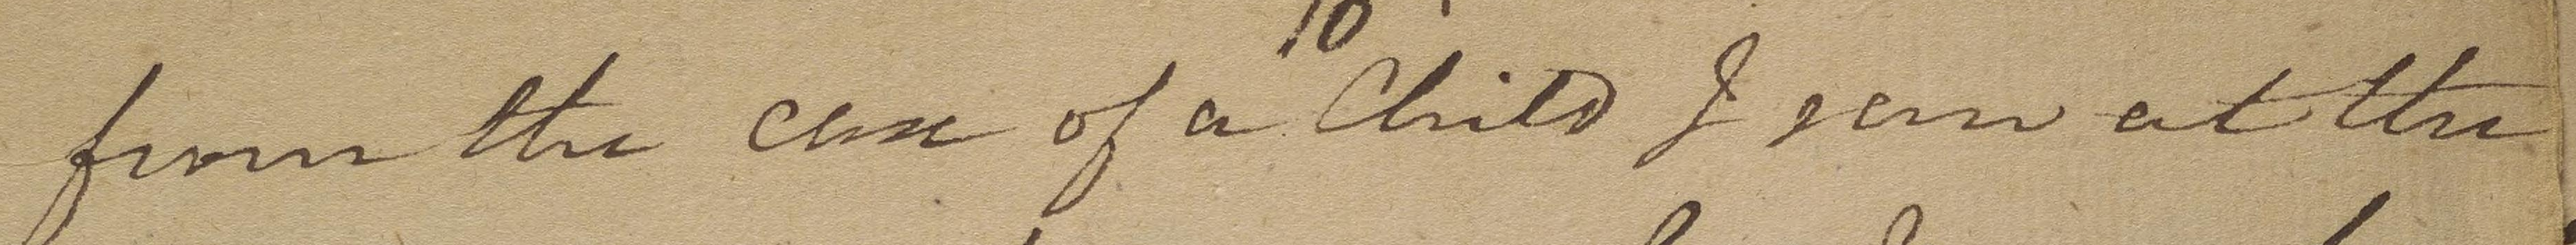from the case of a Child I saw at the
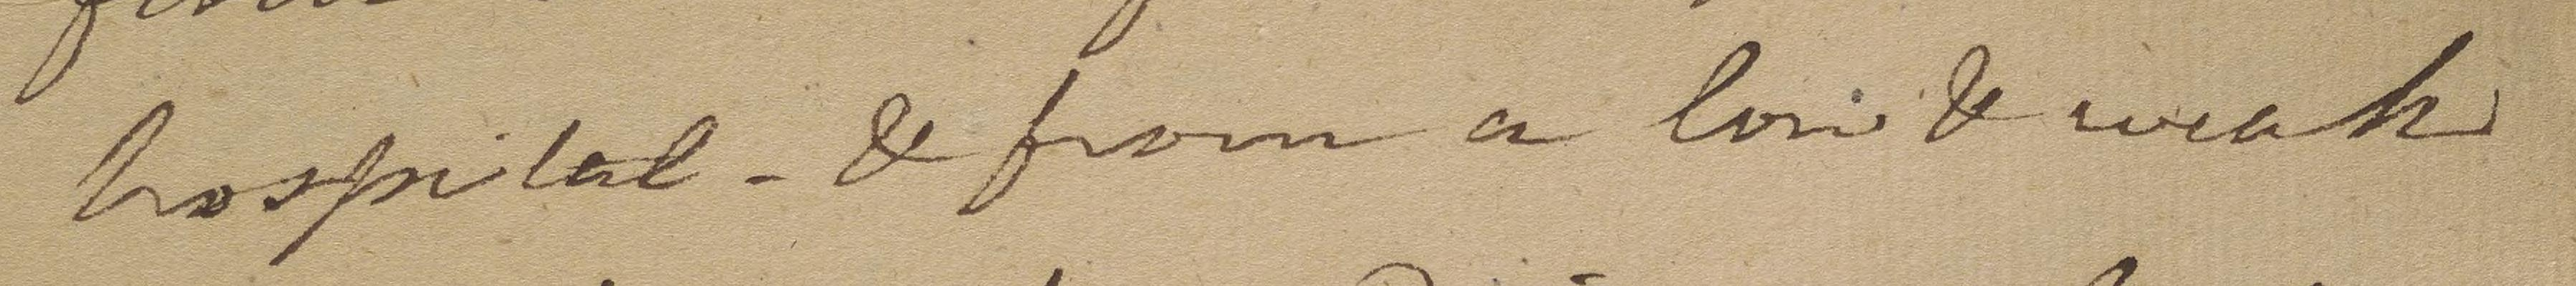hospital- & from a low & weak
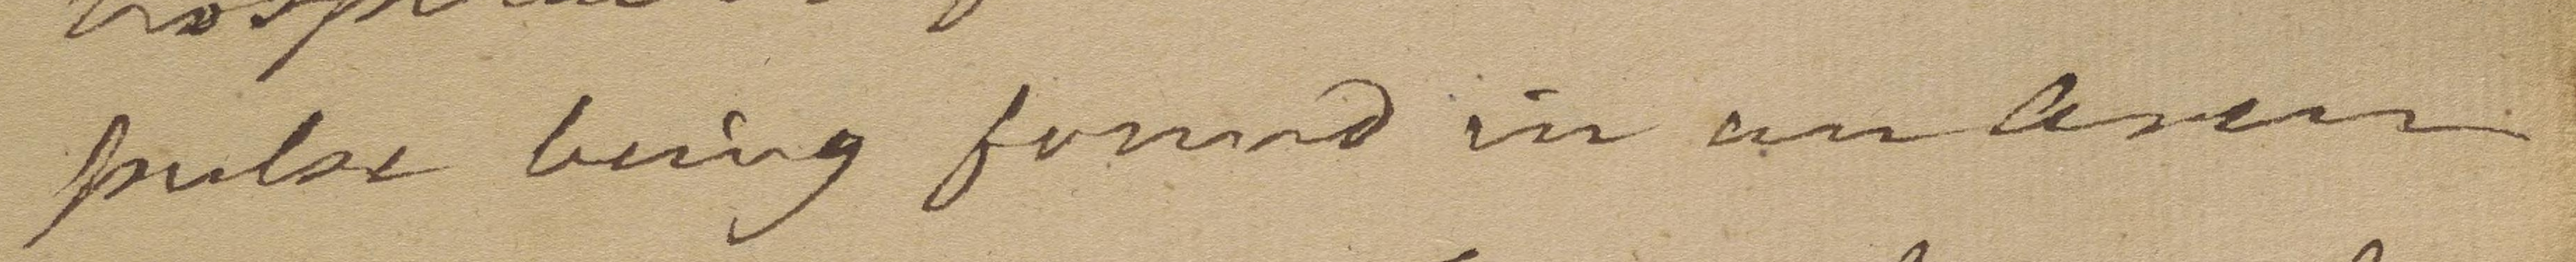pulse being found in an aren
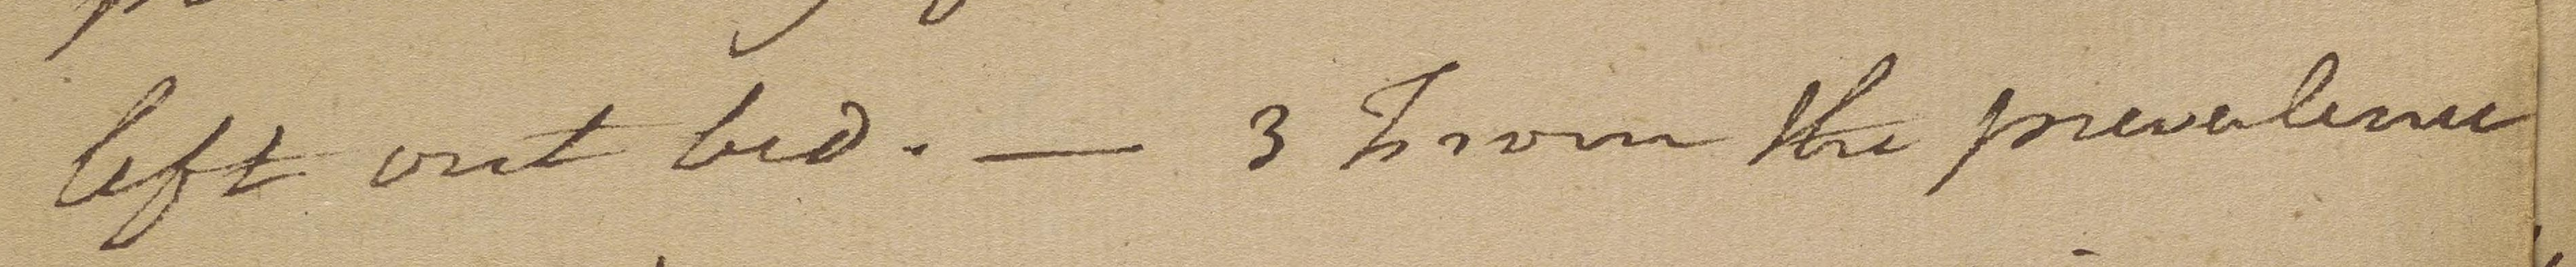left out bed.- 3 From the prevalence
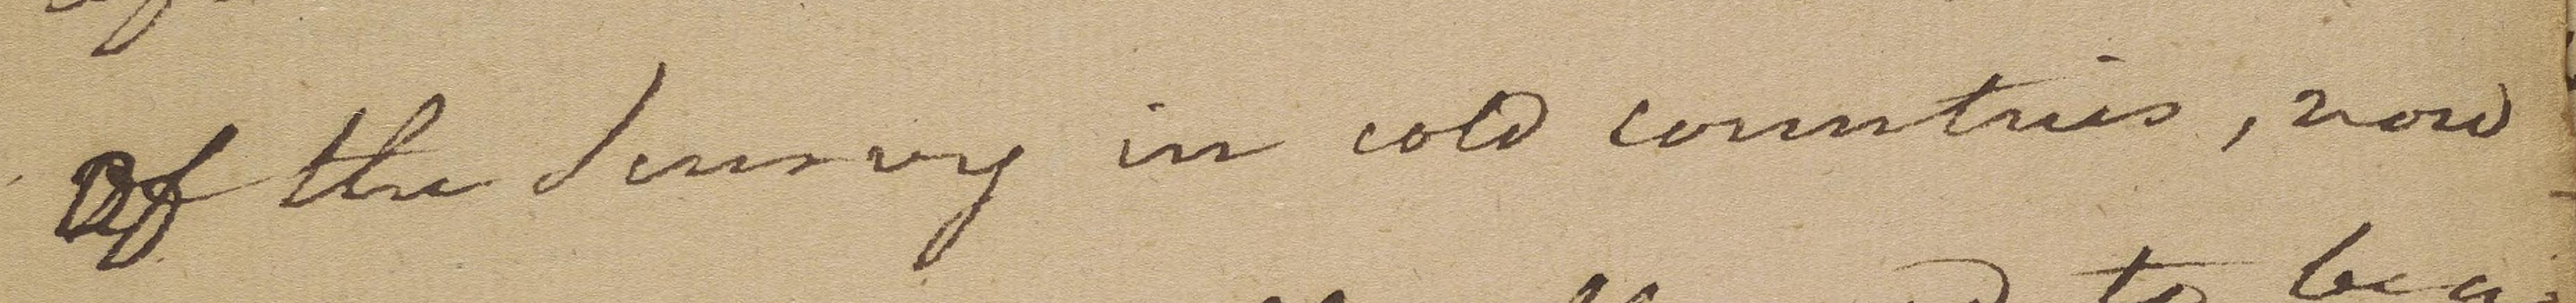of the scurvy in cold countries, now
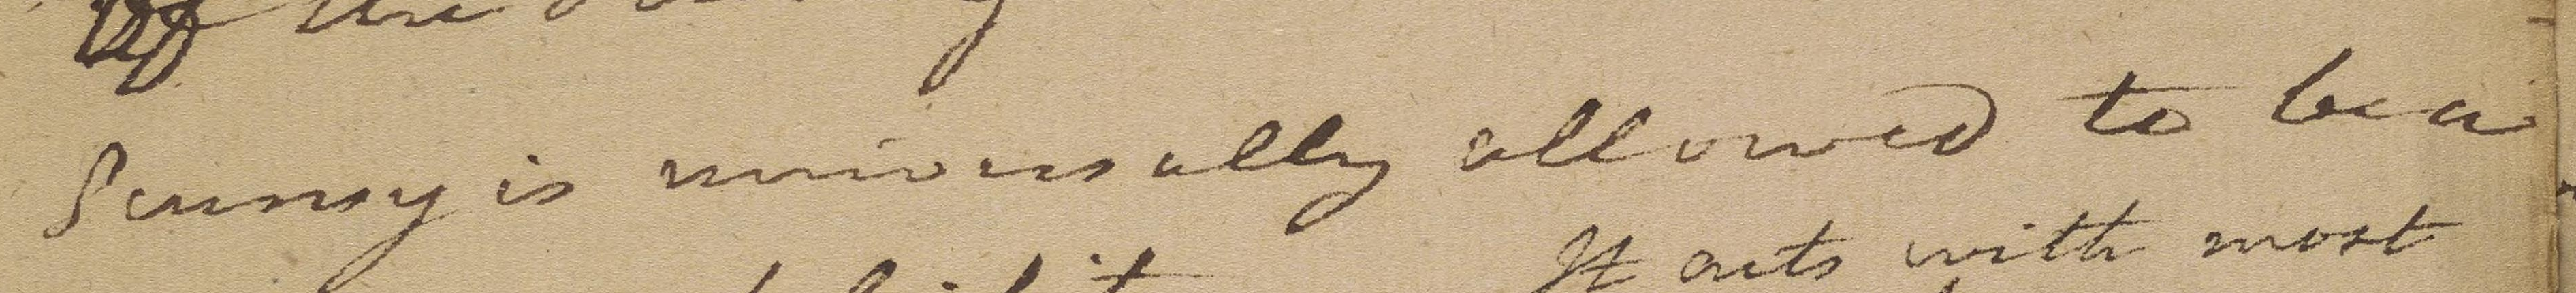Scurvy is universally allowed to be a
